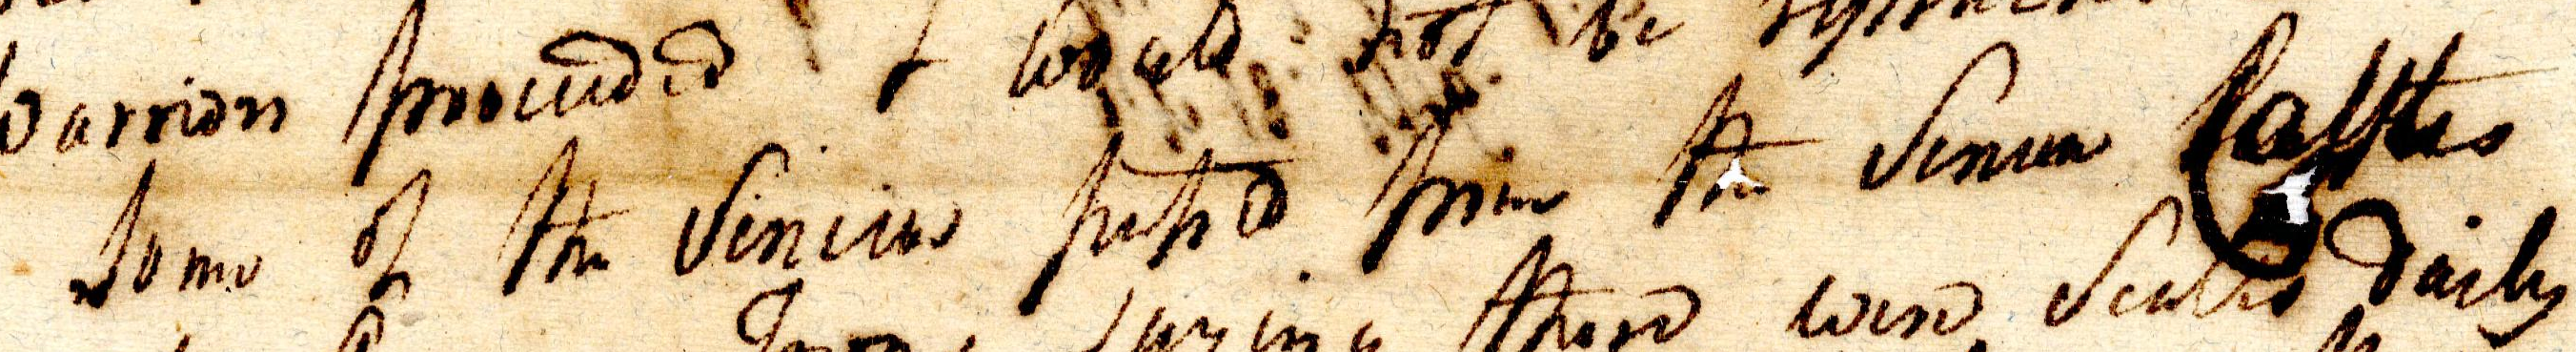Some of the Senecas passed from the Seneca Castles
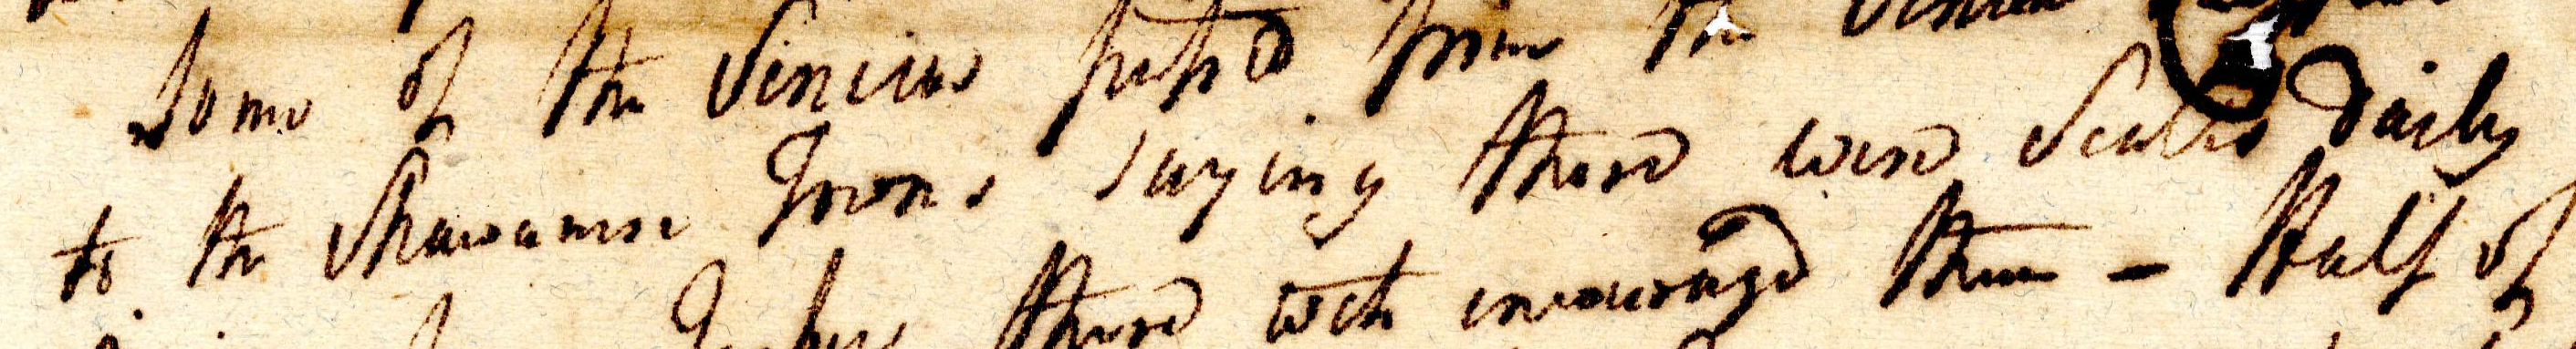to the Shawanese Towns saying there were Scalps daily
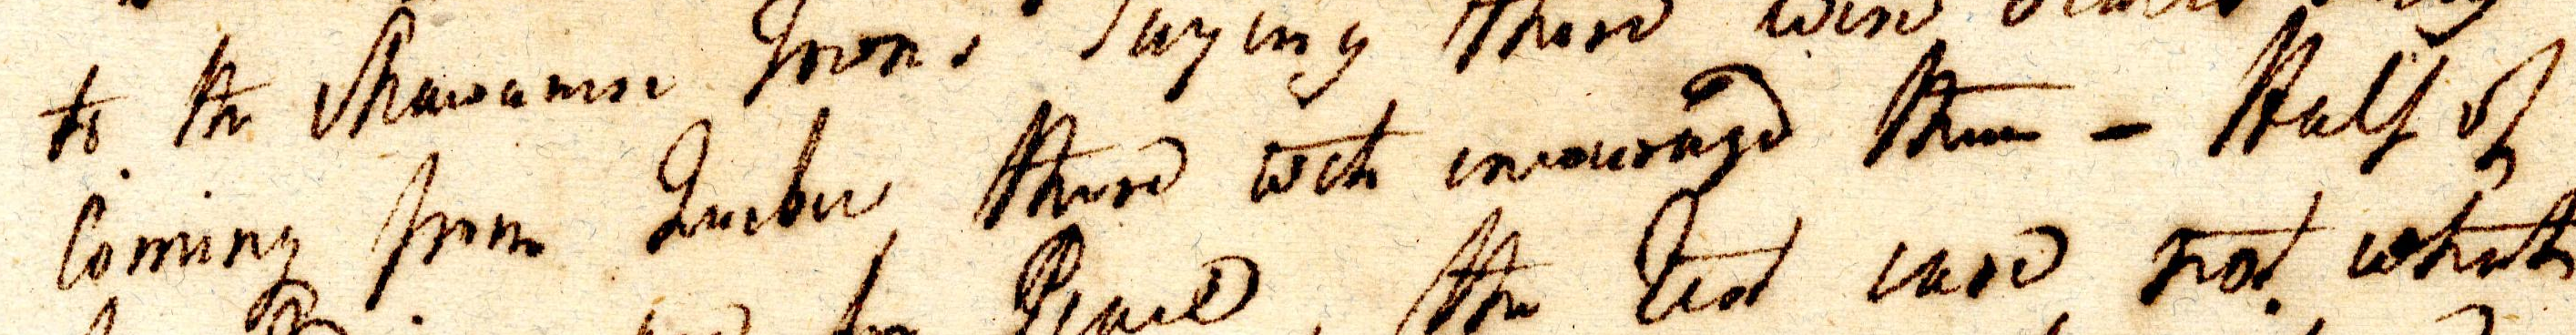coming from Quebec there wch encourag'd them- Half of
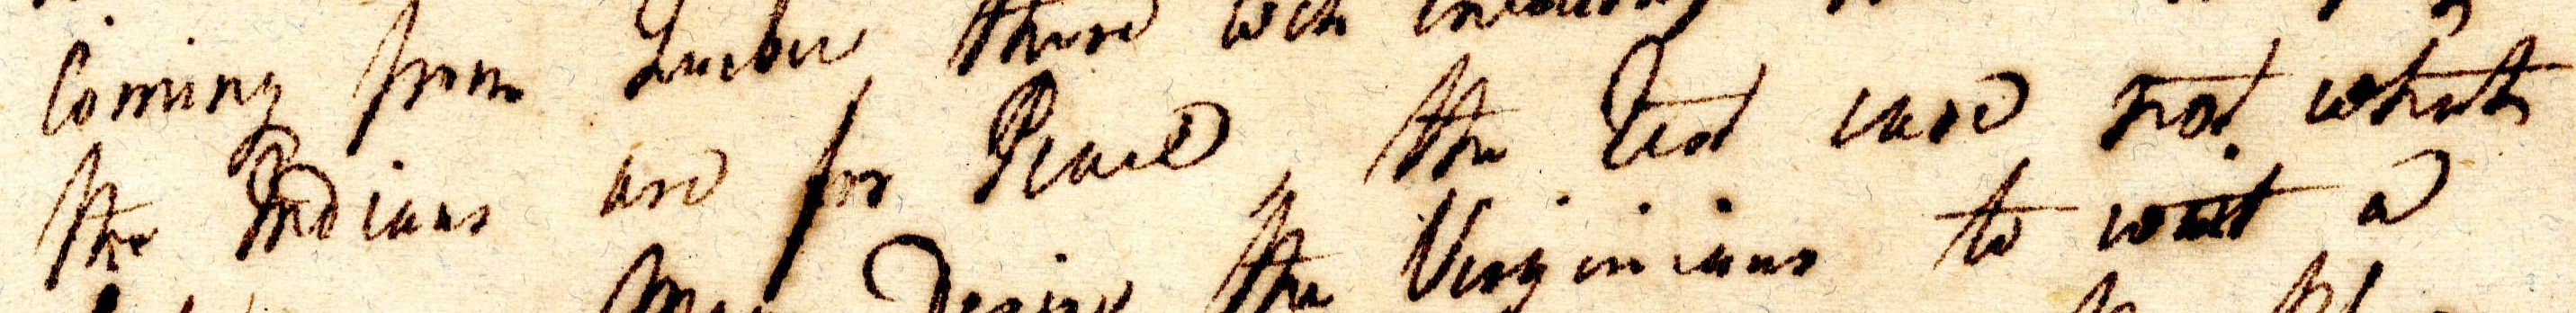the Indians are for Peace, the rest care not what
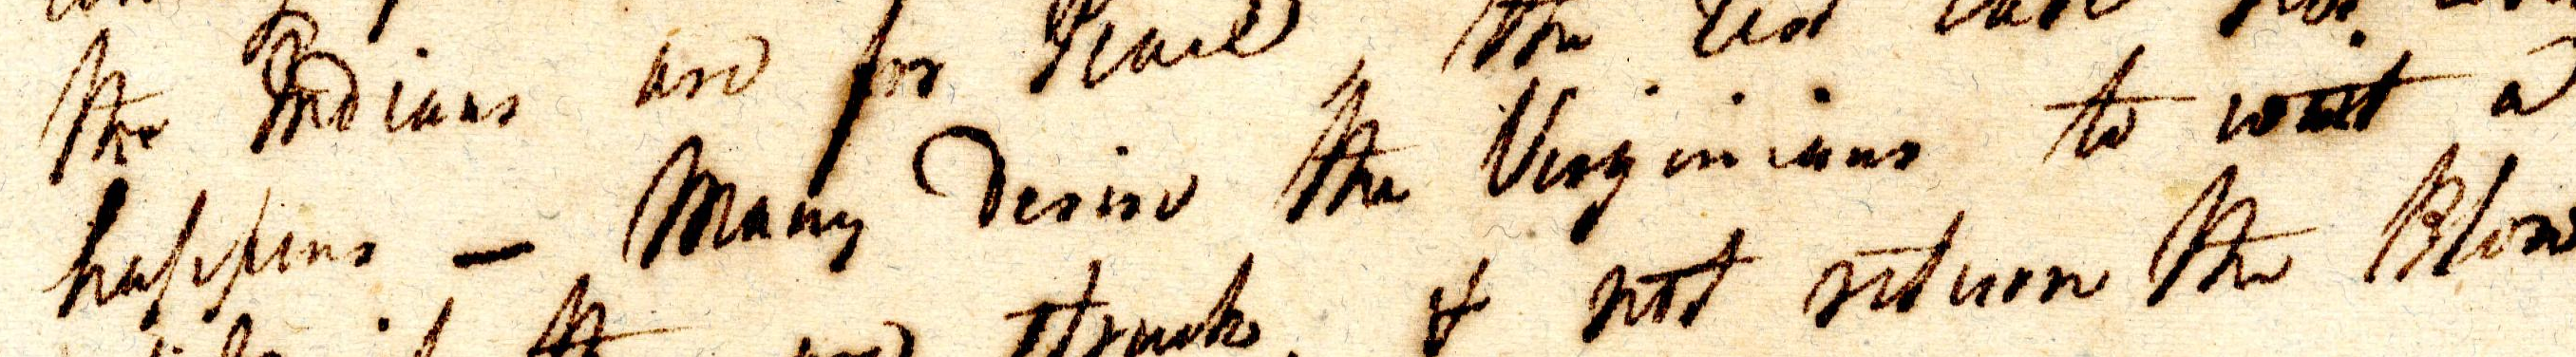happens- Many desire the Virginians to wait a
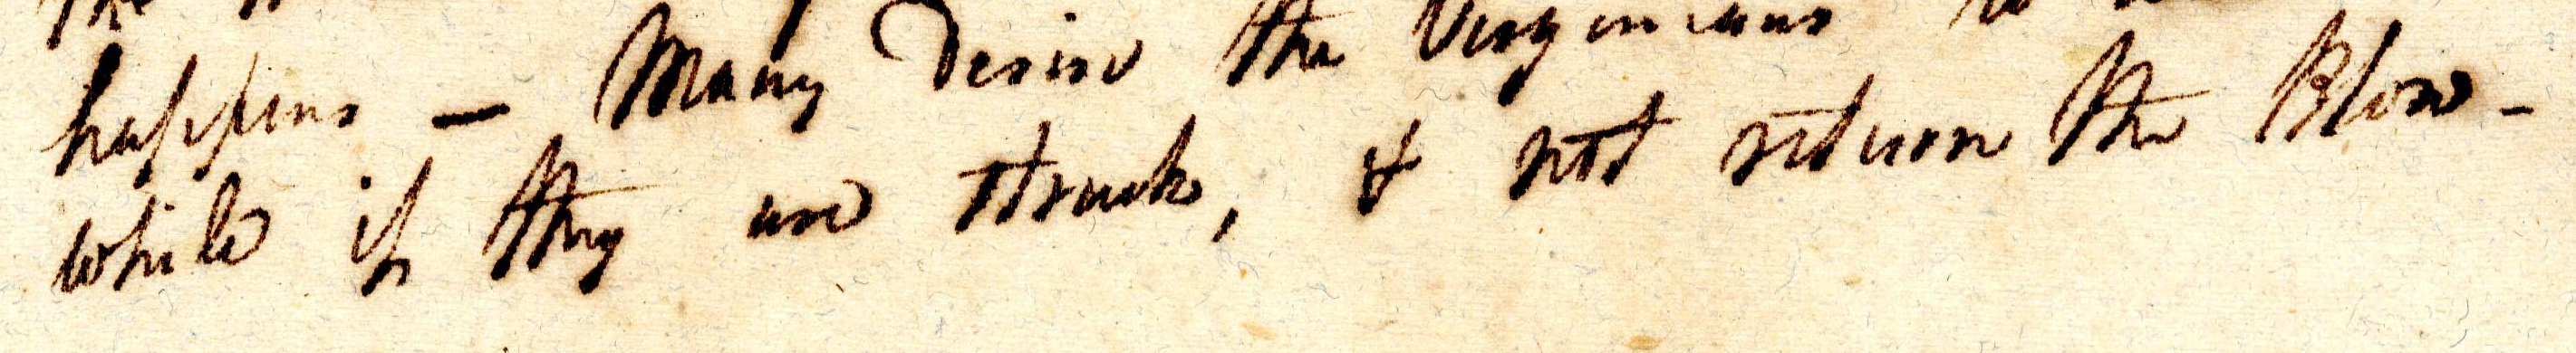while if they are struck, & not return the Blow-
